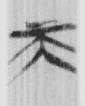天
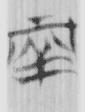兩
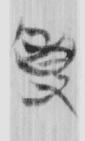事
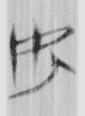𡚦
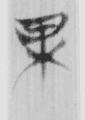果
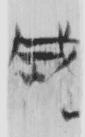成
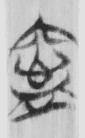{穴心皿}
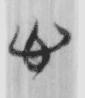心
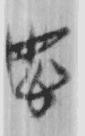悔
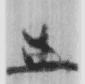之
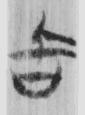旨
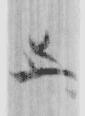之
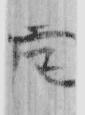厇
